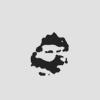色
